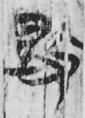○（注）
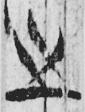之
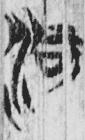河
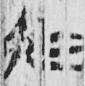於
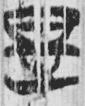是
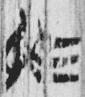於（乎）
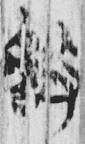敘（豫）
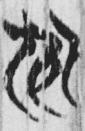州
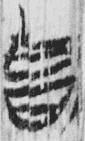○（始）
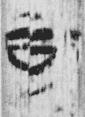可
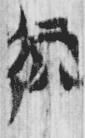凥（處）
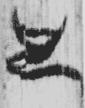也
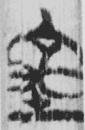○（禹）
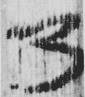乃
